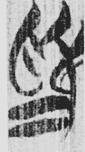爲
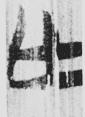亡（無）
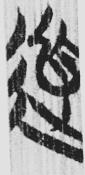道
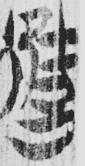擁
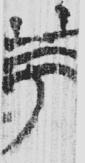芋（華）
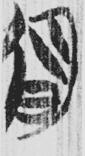○（明）
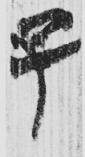子
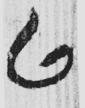㠯（以）
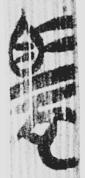○（馳）
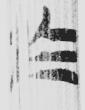於
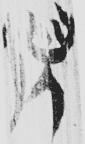倪（郳）
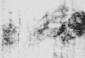市
